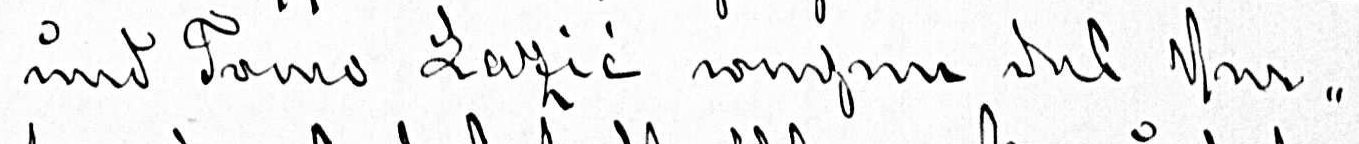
und Tomo Lazić wegen des Ver¬
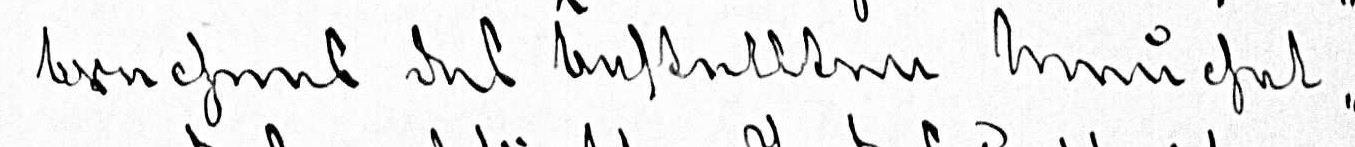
brechens des bestellten Meuchel¬
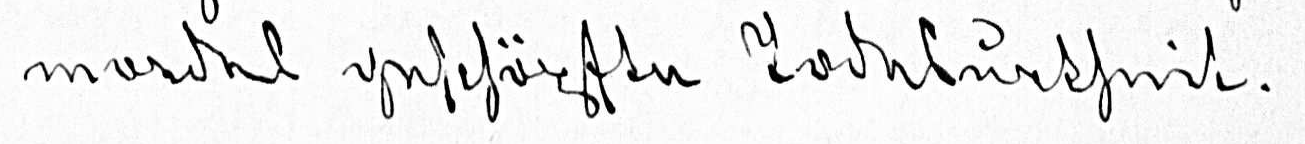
mordes geschöpfte Todesurtheil.
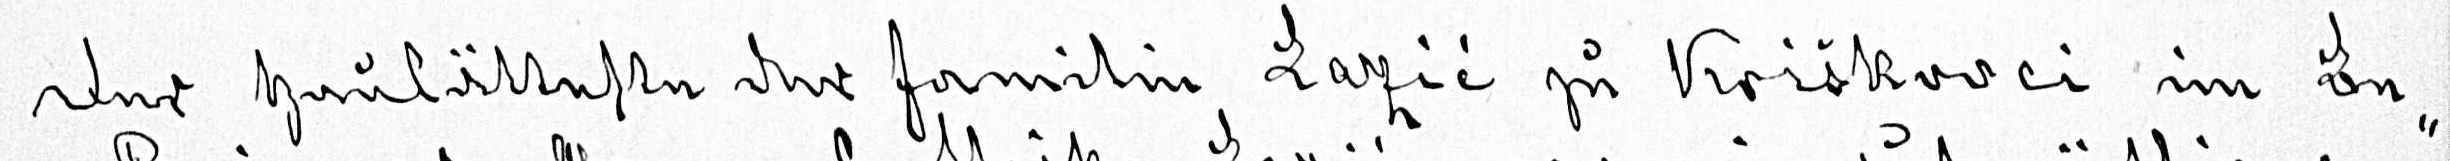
Der Hausälteste der Familie Lazić zu Kriškovci im Be¬
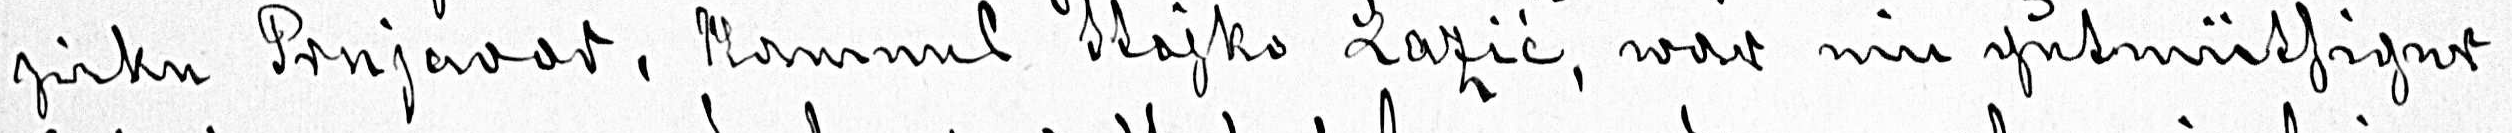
zirke Prejavod, Namens Stojko Lazić, war ein gutmüthiger
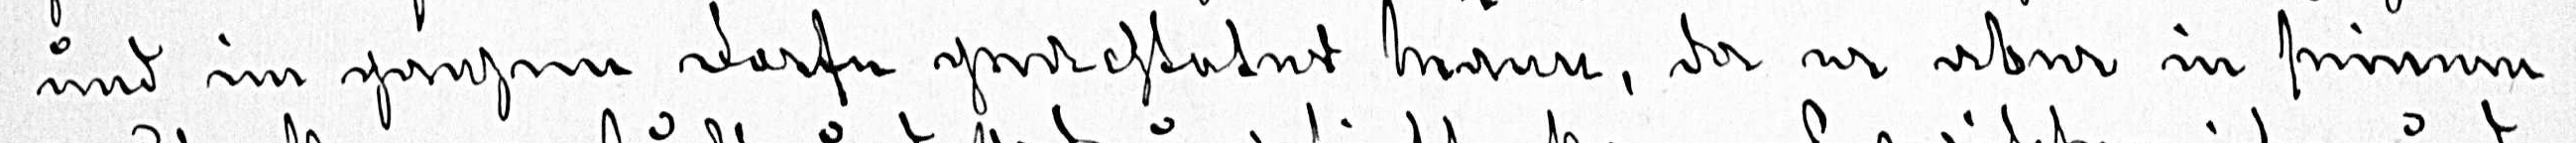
und im gegen Dorfe geachteter Mann, der er aber in seinem
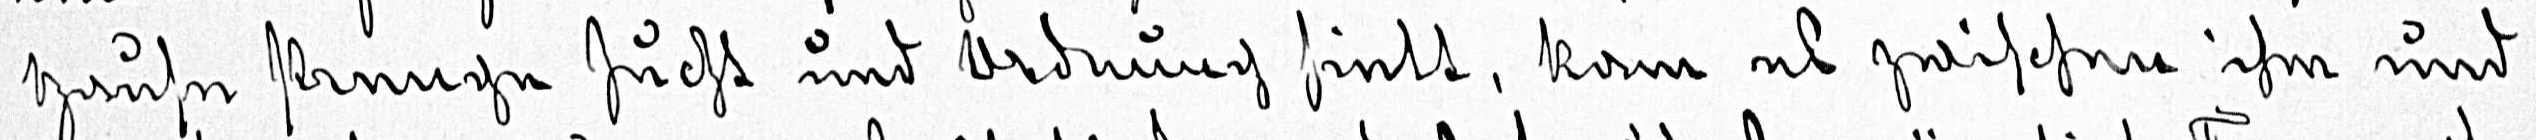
Hause Strenge Zucht und Ordnung hielt, kam es zwischen ihm und
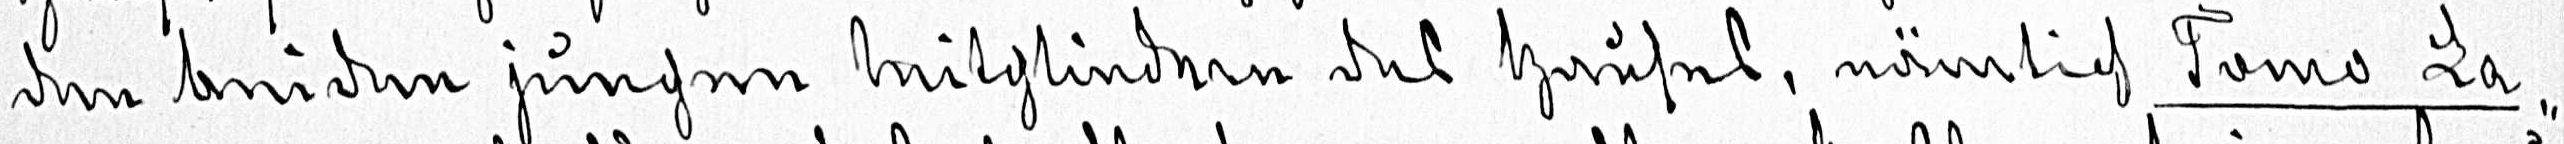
den beiden jungen Mitgliedern des Hauses, nämlich Tomo La¬
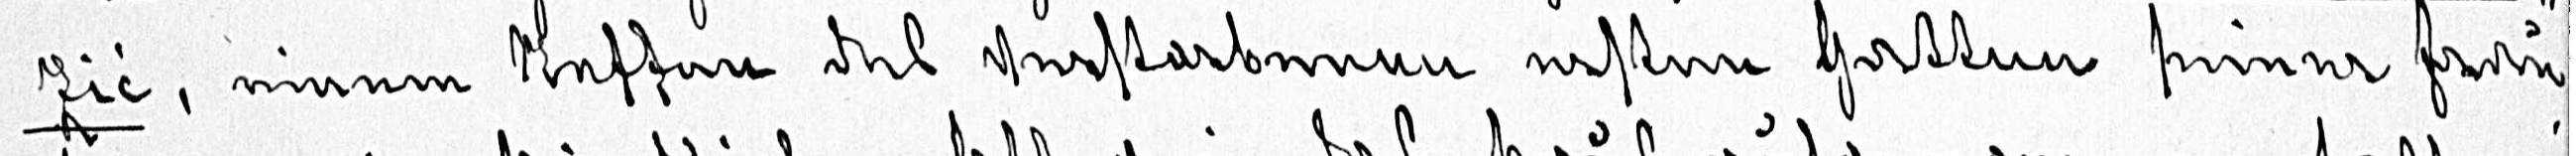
zić, einem Neffen des verstorbenen ersten Gatten seiner Frau
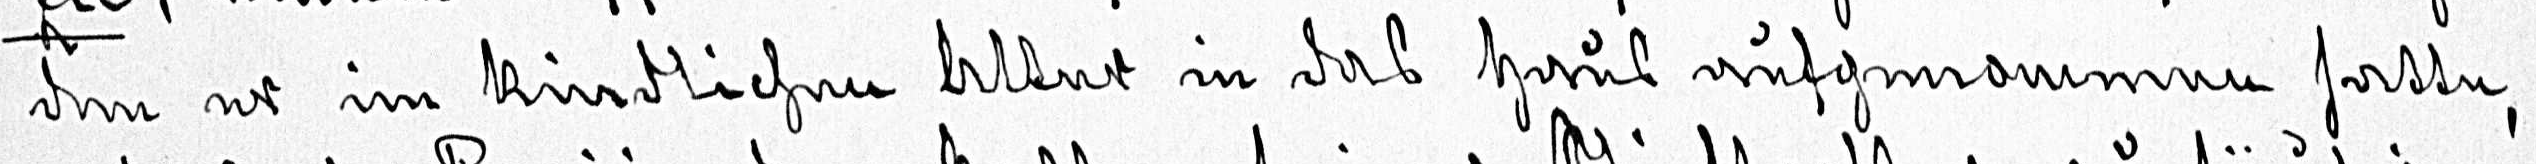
den er im Kindlichen Alter in das Haus aufgenommen hatte,
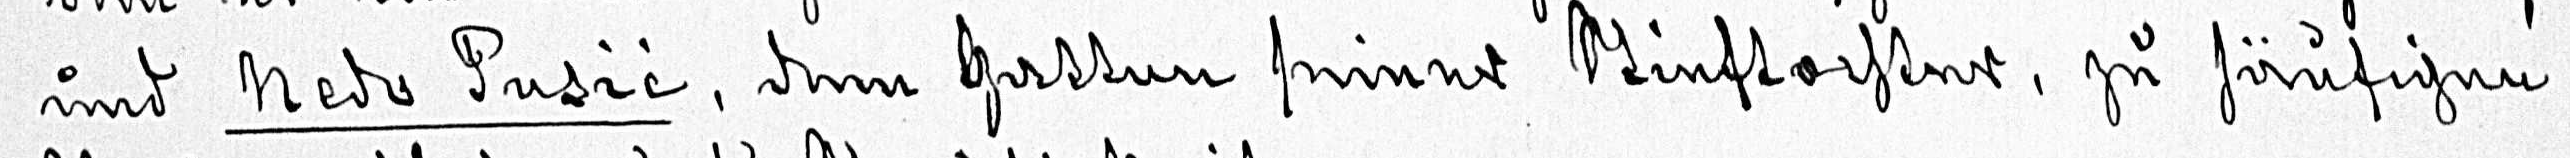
und Nedo Pusić, dem Gatten seines Stieftochter, zu häufigen
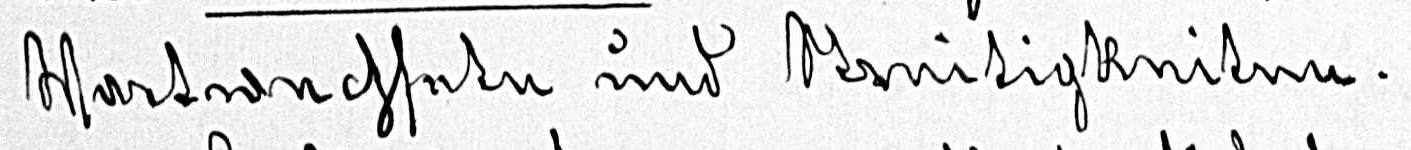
Wortwechseln und Streitigkeiten.
